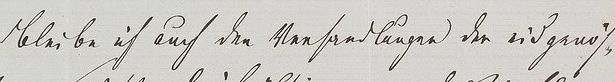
Bleibe ich auch den Verhandlungen der eidgenös-
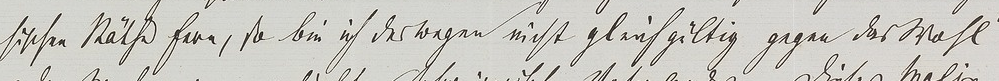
sischen Räthe fern, so bin ich deswegen nicht gleichgültig gegen das Wohl
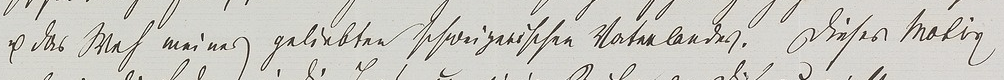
& das Weh meines geliebten schweizerischen Vaterlandes. Dieses Motiv
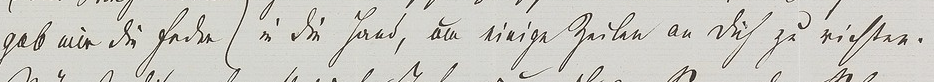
gab mir die Feder in die Hand, um einige Zeilen an Dich zu richten.
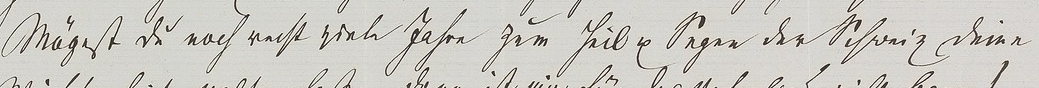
Mögest du noch recht viele Jahre zum Heil & Segen der Schweiz Deine
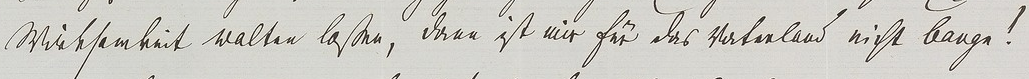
Wirksamkeit walten lassen, dann ist mir für das Vaterland nicht bange!
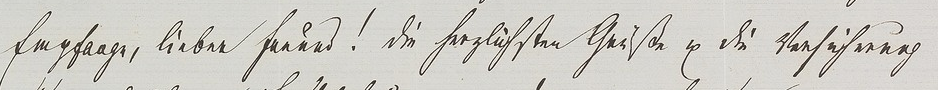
Empfange, lieber Freund! die herzlichsten Grüße & die Versicherung
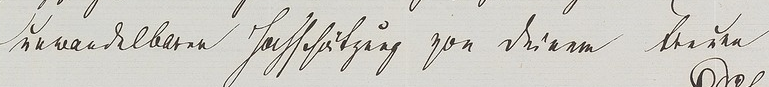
unwandelbarer Hochschätzung von Deinem treuen
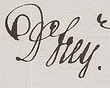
Frey.
